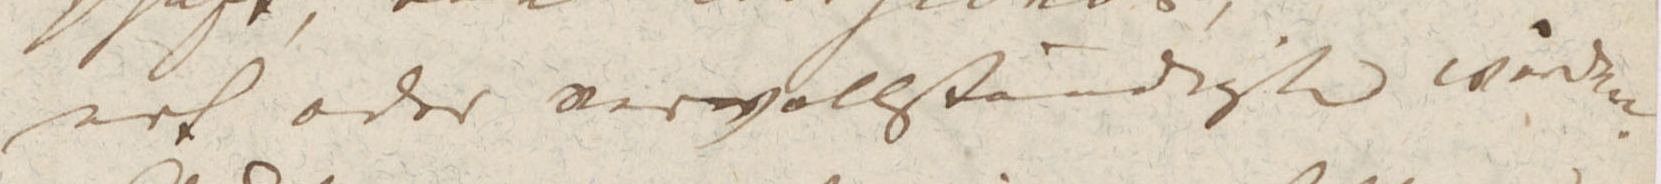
ert oder vervollständigt wurden.
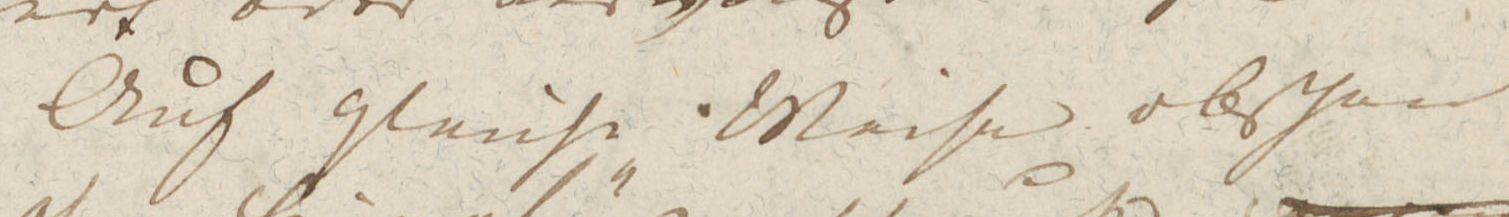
Auf gleiche Weise obschon
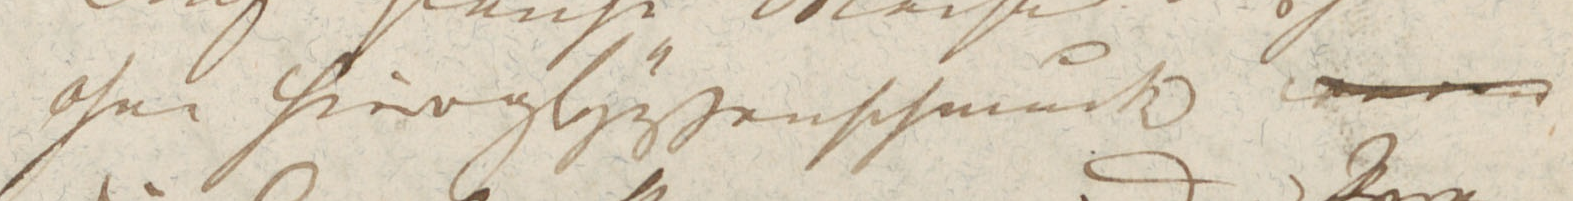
ohne Hieroglyphenschmuck waren
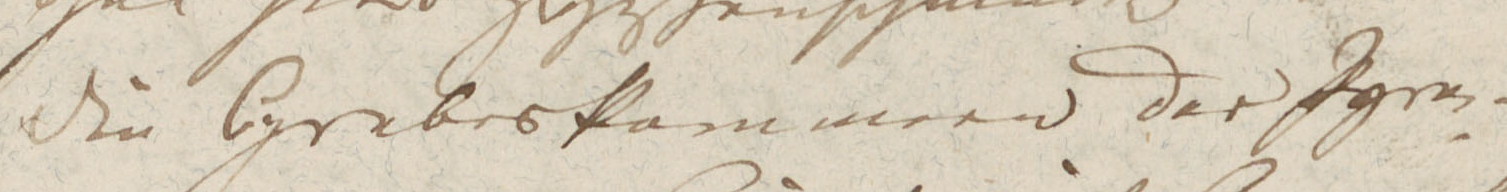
die Grabeskammern der Pyra-
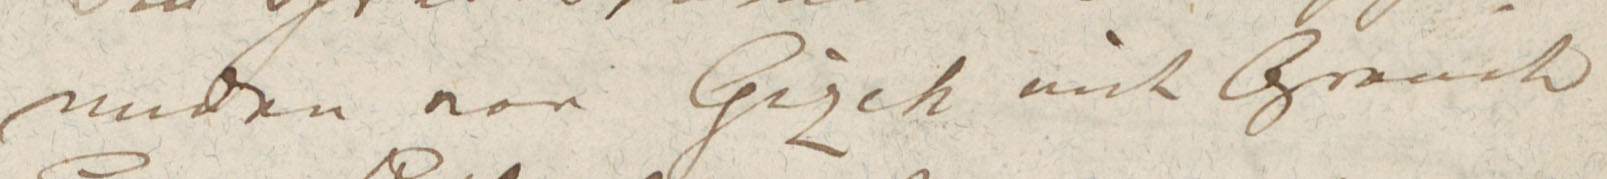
miden vor Gizeh mit Granit
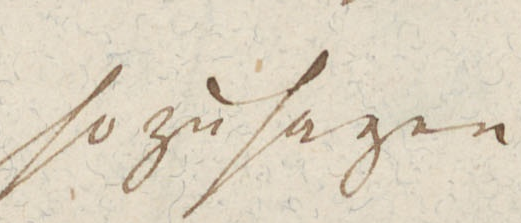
so zu sagen
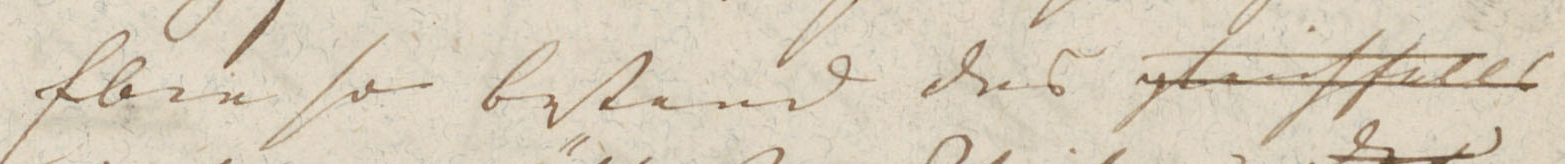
Eben so bestand das gleichfalls
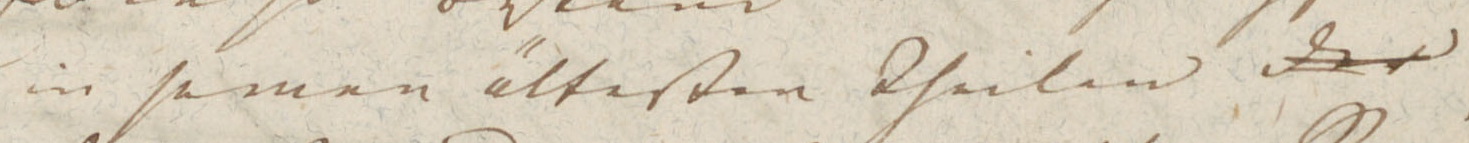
in seinen ältesten Theilen der
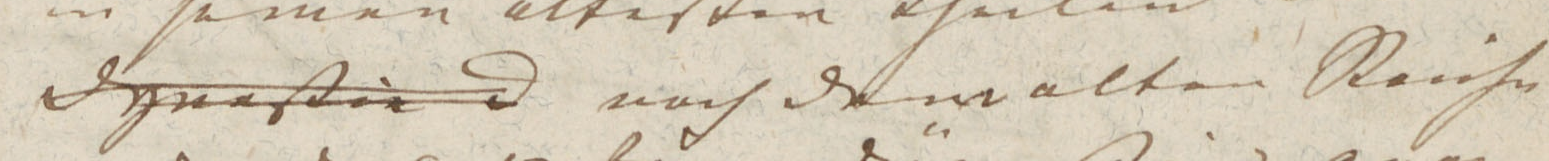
Dynastie d noch dem alten Reiche
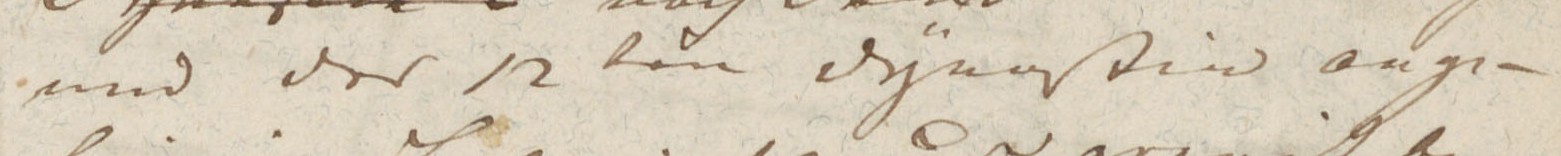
und der 12ten Dynastie ange-
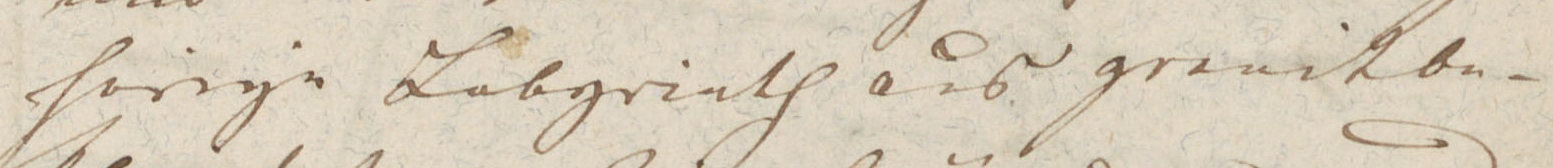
hörige Labyrinth aus granitbe-
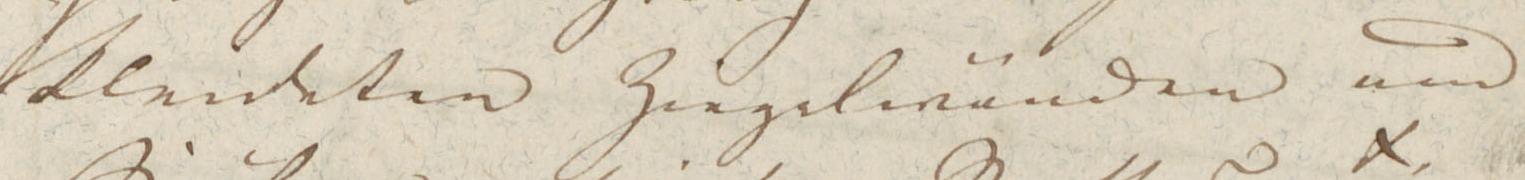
kleideten Ziegelwänden und
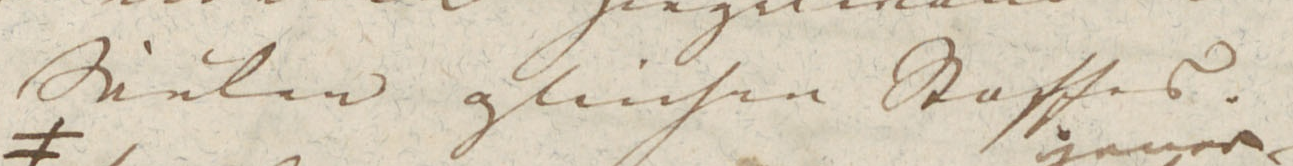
Säulen gleichen Stoffes. %
